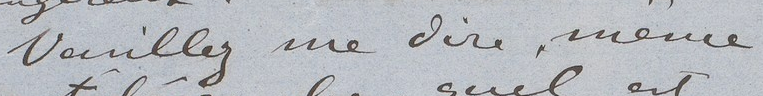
Veuillez me dire, même
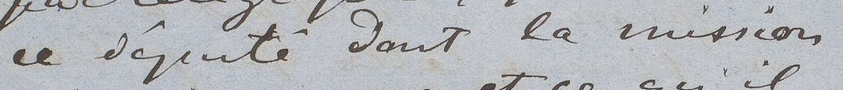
ce député dont la mission
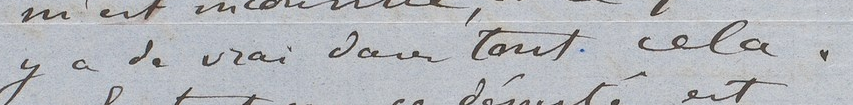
y a de vrai dans tout cela.
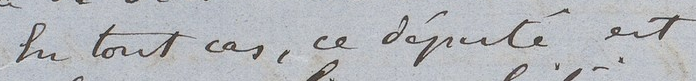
En tout cas, ce député est
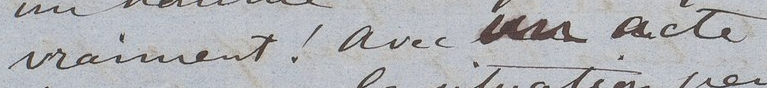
vraiment! Avec un acte
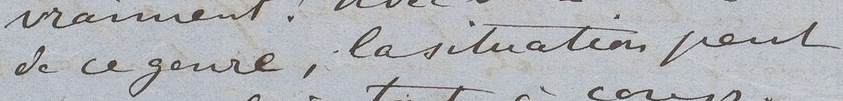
de ce genre, la situation peut
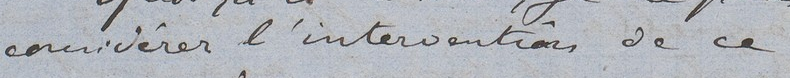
considérer l'intervention de ce
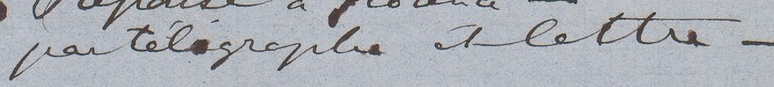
par télégraphe et lettre –
